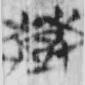登
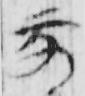亥
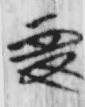妾
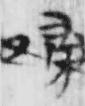婦
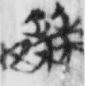娕
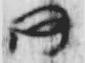尹
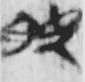胺
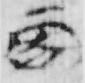丙
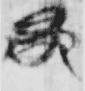君
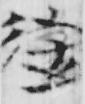遊
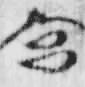宮
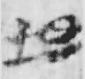坦
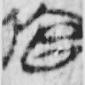倌
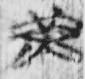黃
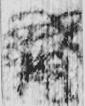贛
